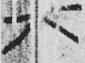亓（其）
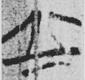丘
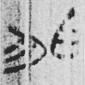非
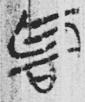台（夷）
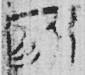所
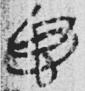思
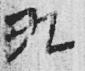九
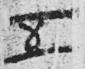五
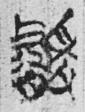○（渙）
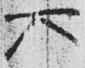亓（其）
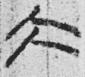大
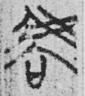○（號）
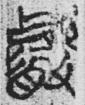○（渙）
